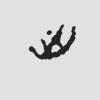出
